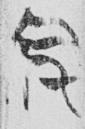○（托）
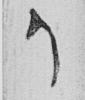人
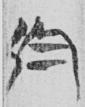於
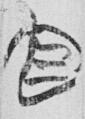官
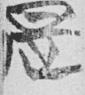是
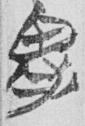{胃刀}（謂）
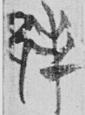邦
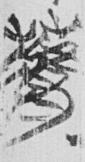○（呂）
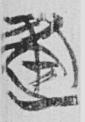建
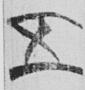五
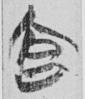官
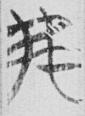弗
